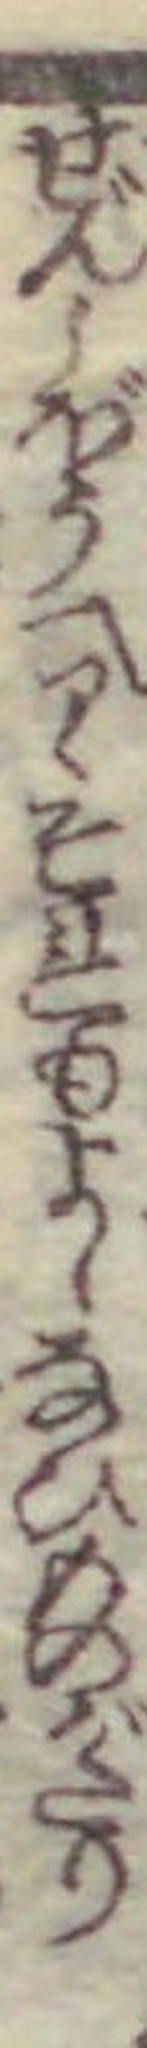ぜんじぼう〽アヽそれもよくなひものがたり
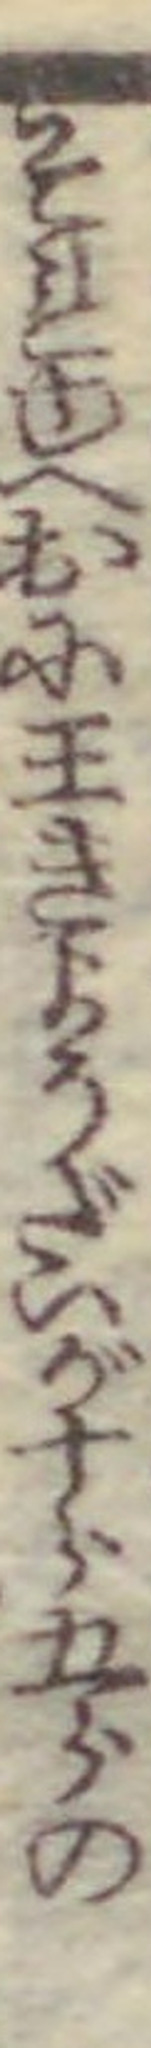それゆへおに王きようだいが十郎五郎の
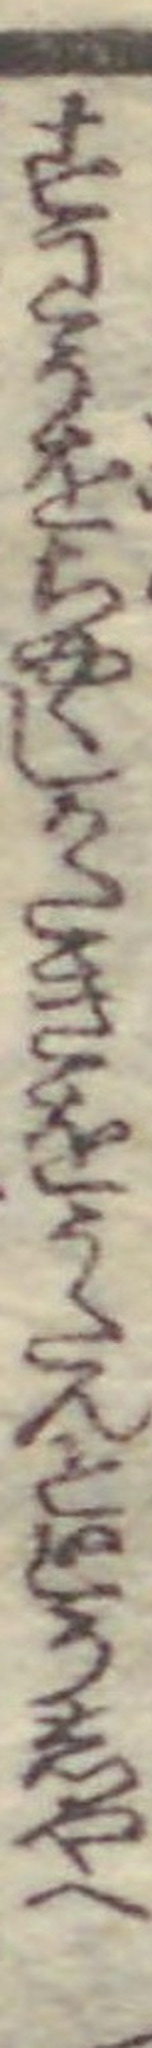すわうをちやくしかたきをうたんととうしやへ
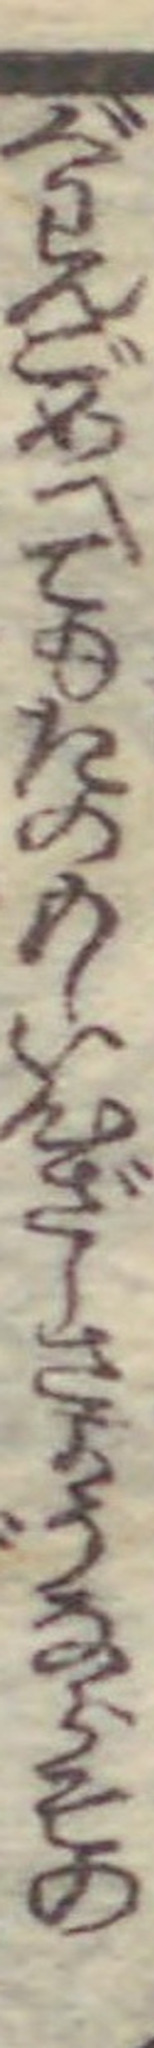ぐわんごめ〽てもたのもしい心ざしさようならその
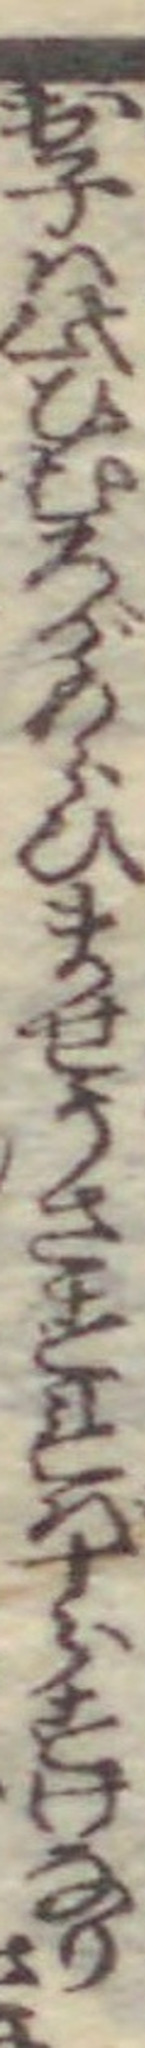お子は此ひむろがもらひませうさすれば十郎すけなりさま
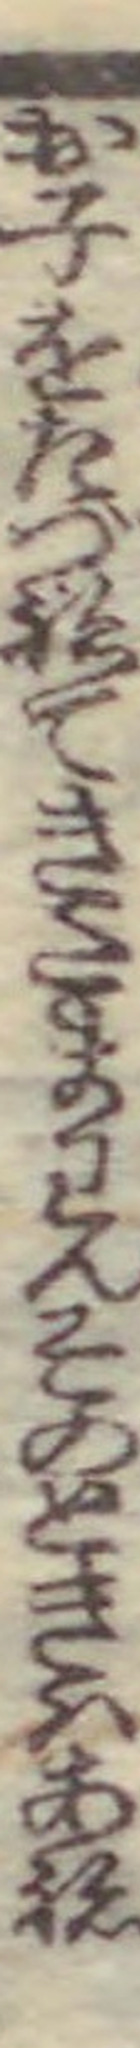お子をたづねてきたまわんそのときはあね
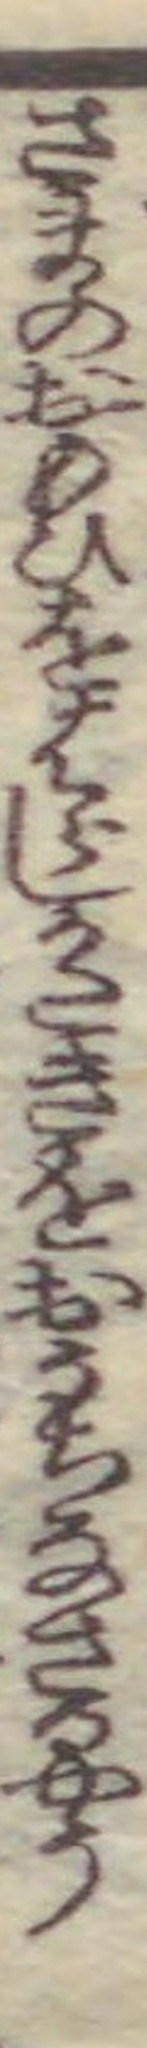さまのおもひをはらしかたきをおうちなさるやう
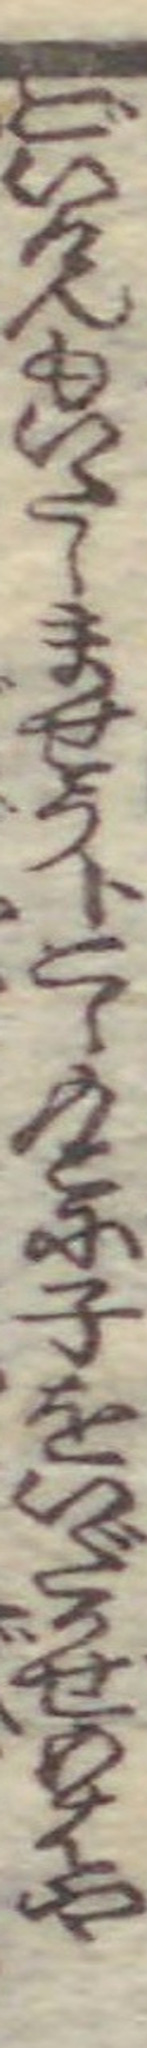ごいけんもいたしませうとこゝもとに子をいだかせもはや
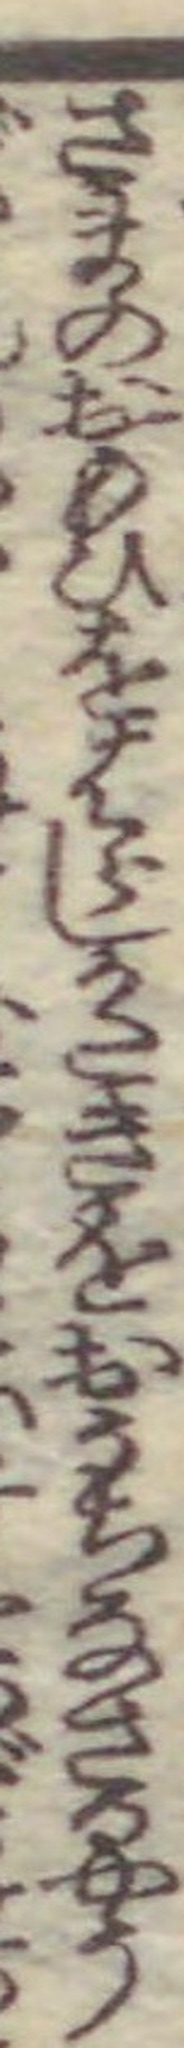さまのおもひをはらしかたきをおうちなさるやう
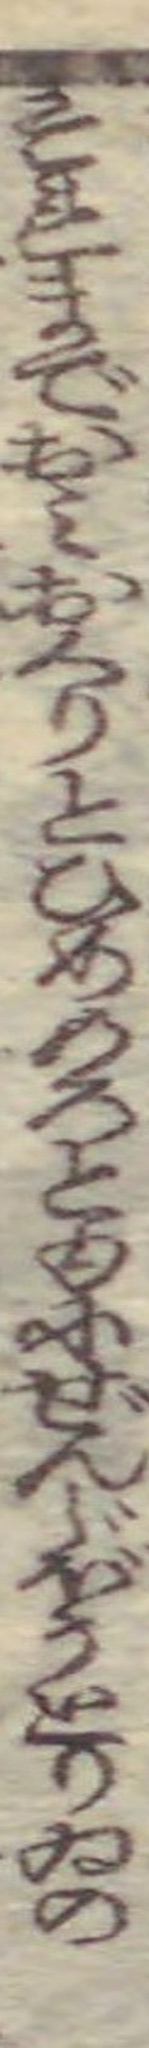それまでおみおくりとひめもろともにぜんじぼうとりゐの
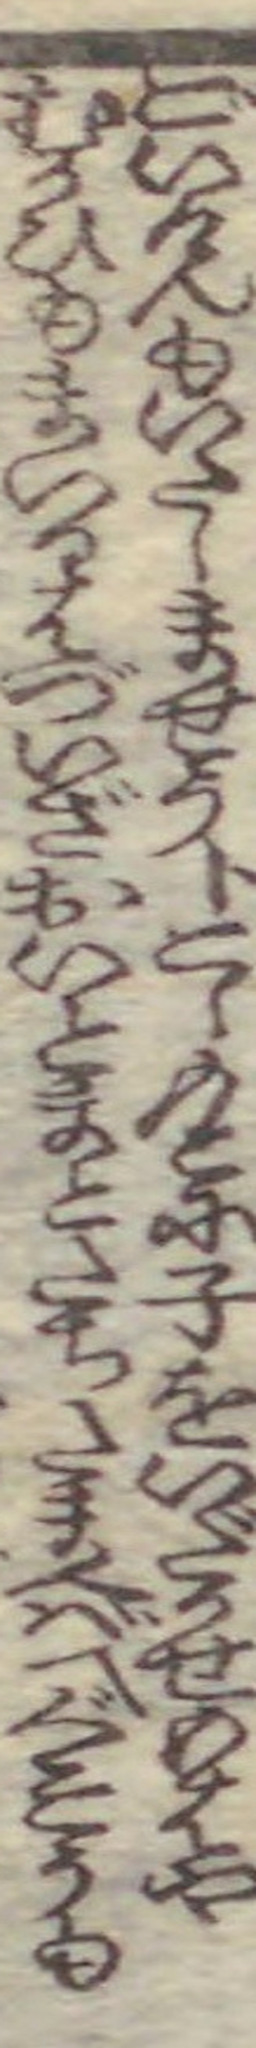むかひもまいるはづいざおいとまとたちたまへば〽ぐそうも
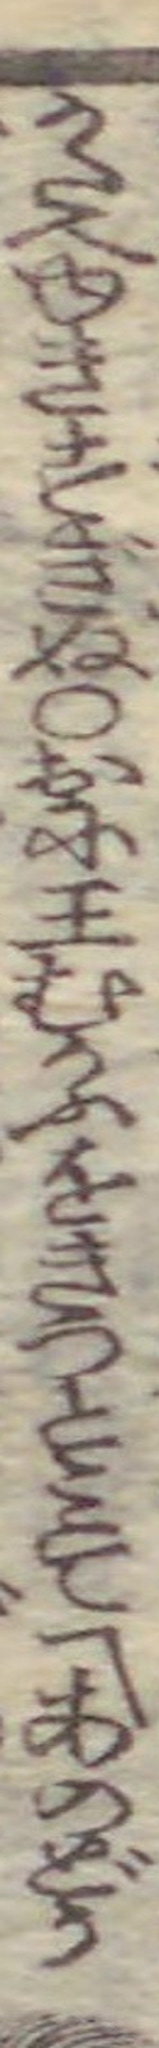かたへゆきすぎぬ○おに王むかふをきつとみて〽あのどう
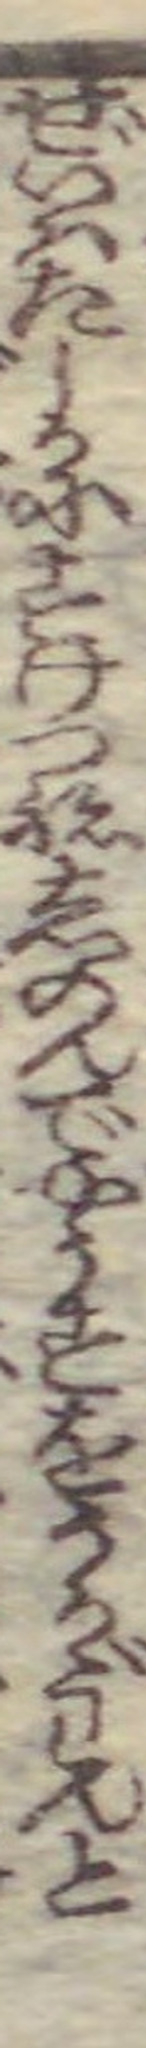ぜいはたしかにすけつねしのんでやうすをうかゞわんと
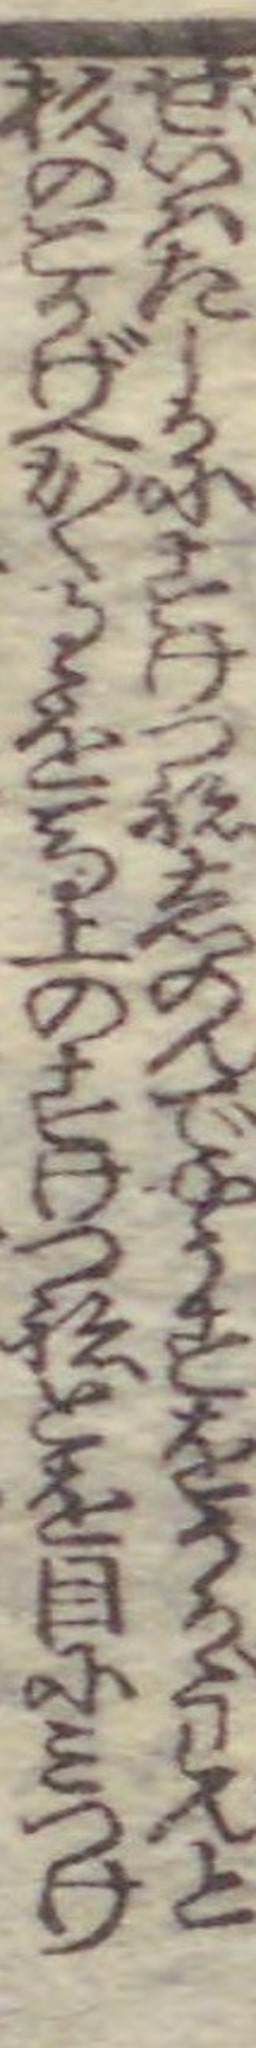杉のこかげへかくるゝを馬上のすけつねとを目にみつけ
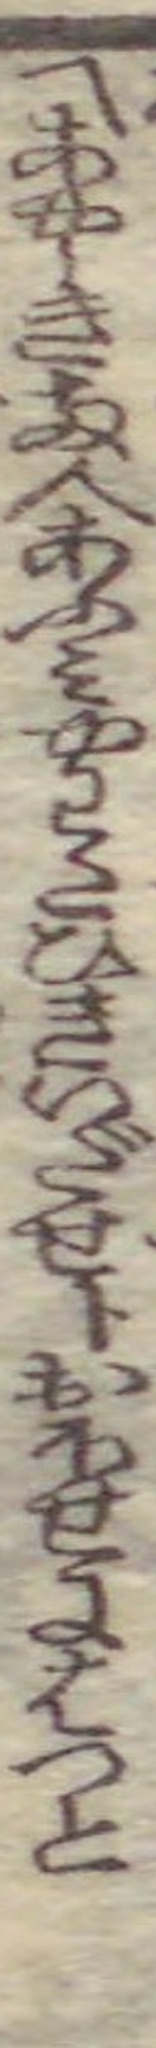〽あやしき両人あふみやわたひきいだせとおほせにはつと
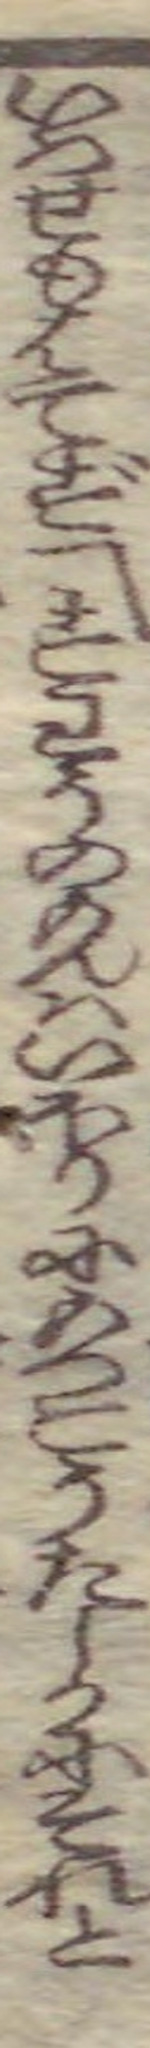いはせもはてず〽すわうのもんはいほりにもつこうたしかにそれと
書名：大時代唐土化物 3巻. 曽我太夫染
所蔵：国立国会図書館 National Diet Library, JAPAN
